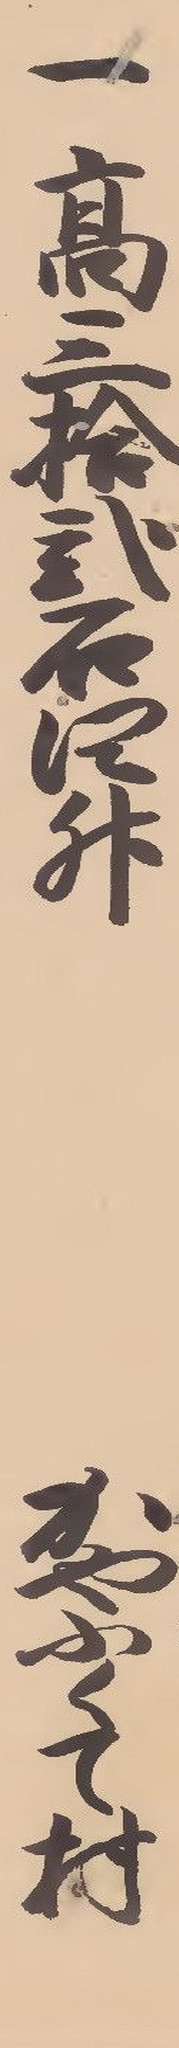一高三拾弐石四升かやふくて村
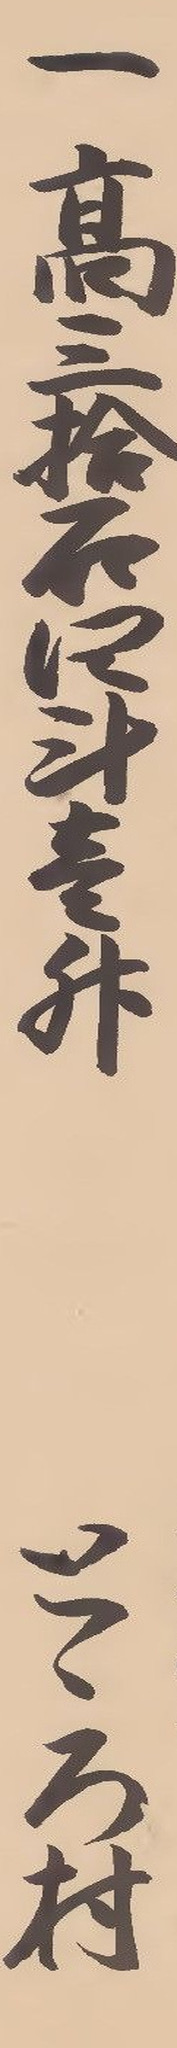一高三拾石四斗壱升ろ村
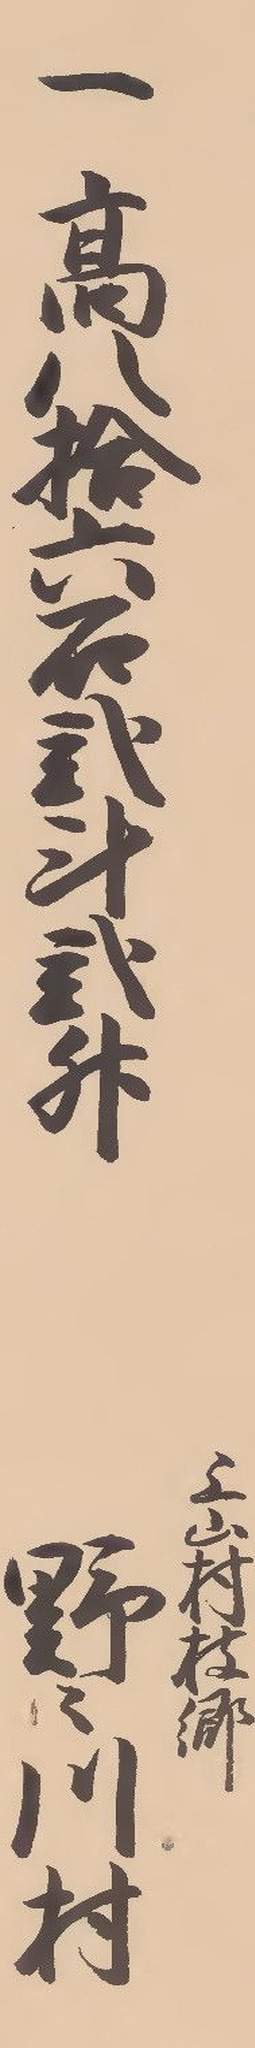一高八拾六石弐斗弐升野々川村
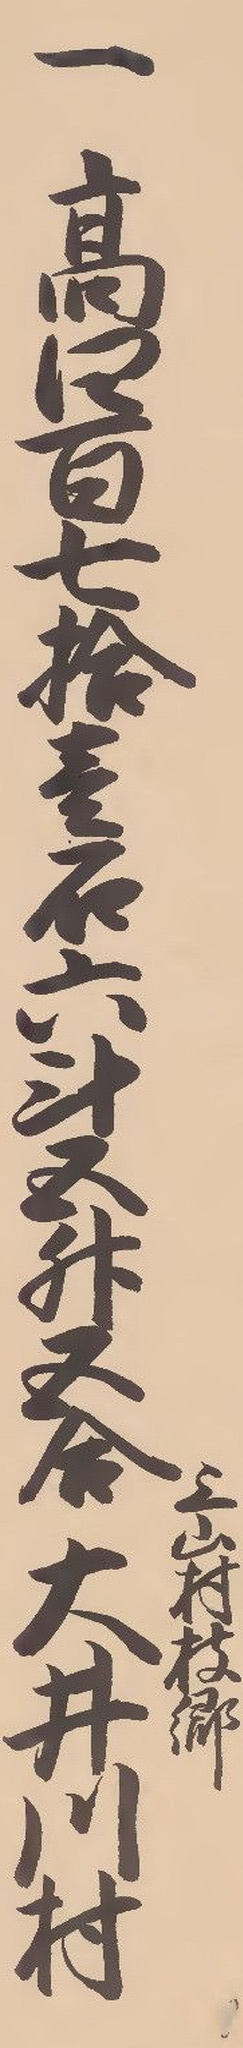一高四百七拾壱石六斗五升五合大井川村
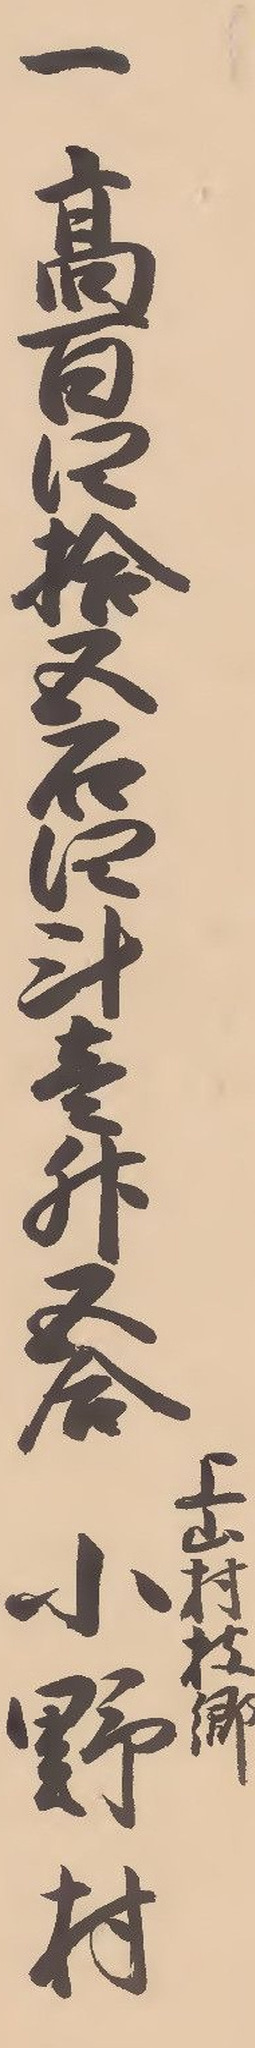一高百四拾五石四斗壱升五合小野村
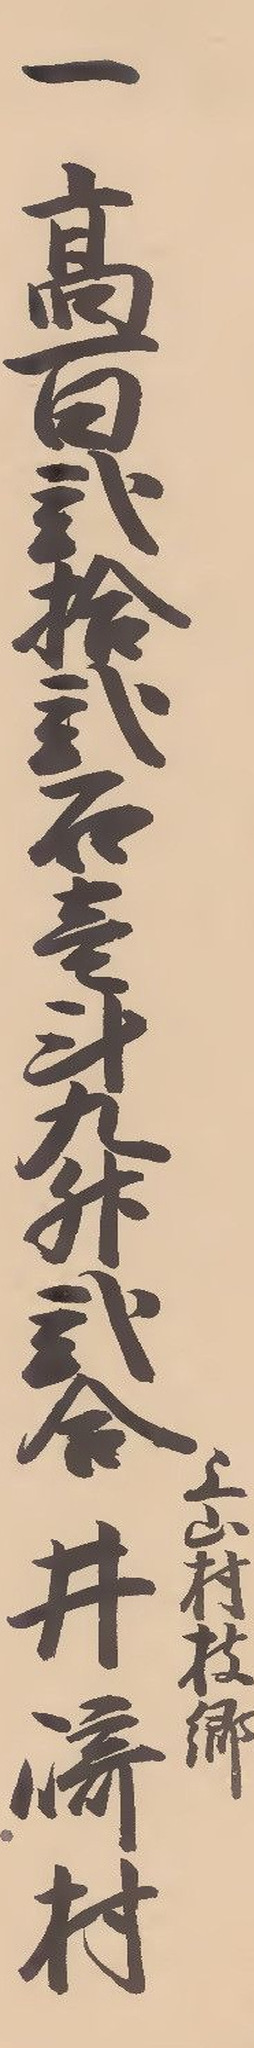一高百弐拾弐石壱斗九升弐合井崎村
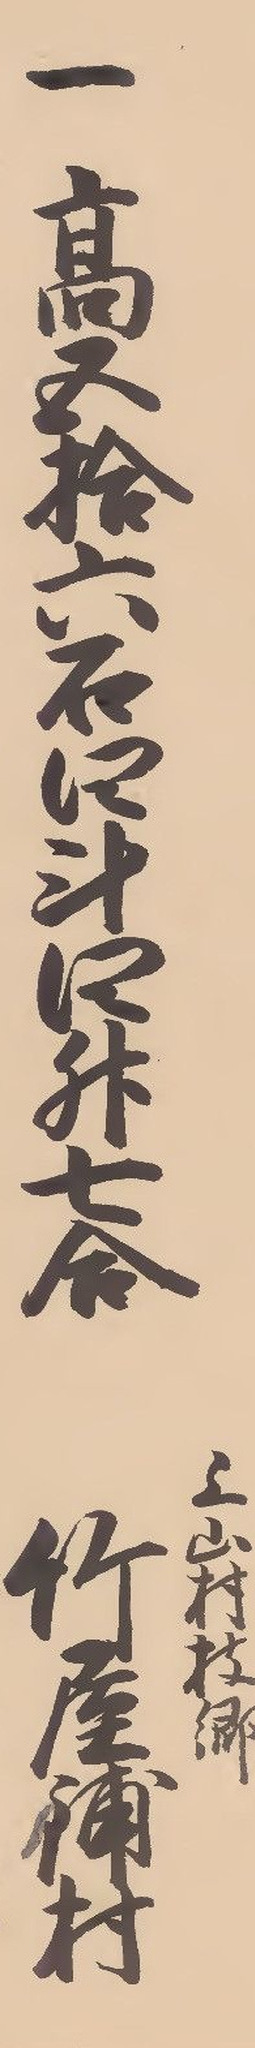一高五拾六石四斗四升七合竹屋浦村
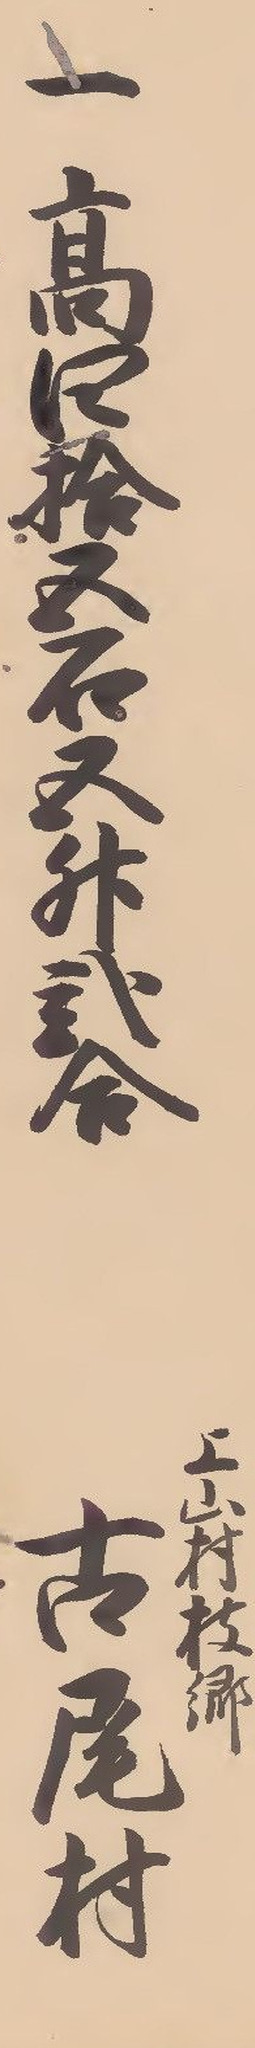一高四拾五石五升弐合古尾村

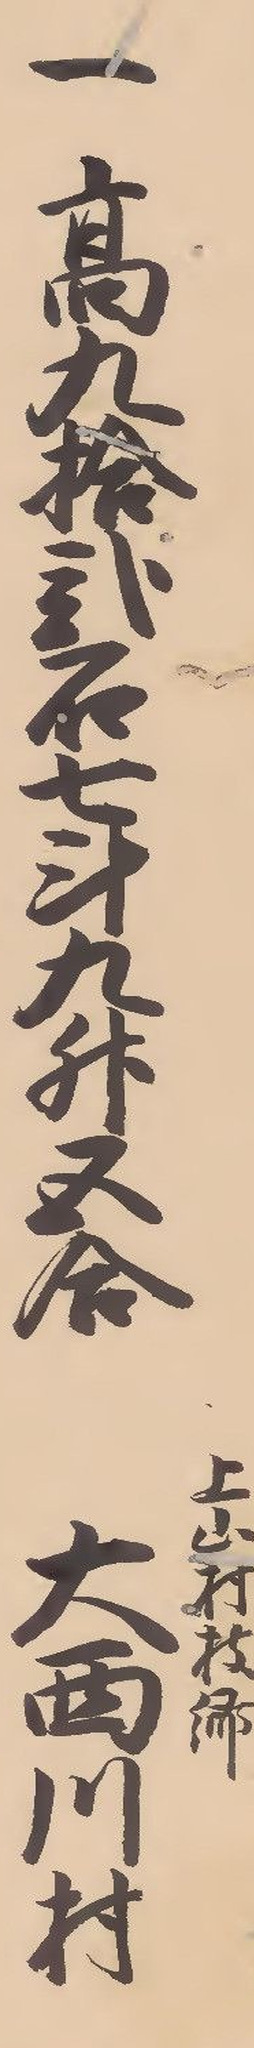一高九拾弐石七斗九升五合大西川村
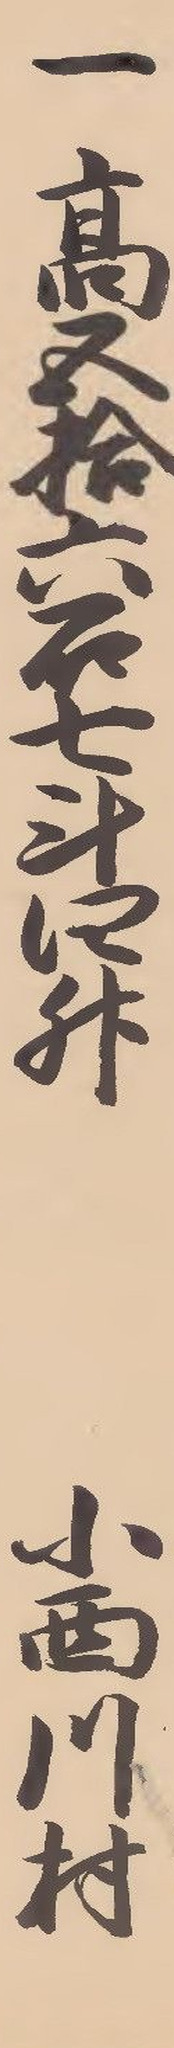一高五拾六石七斗四升小西川村
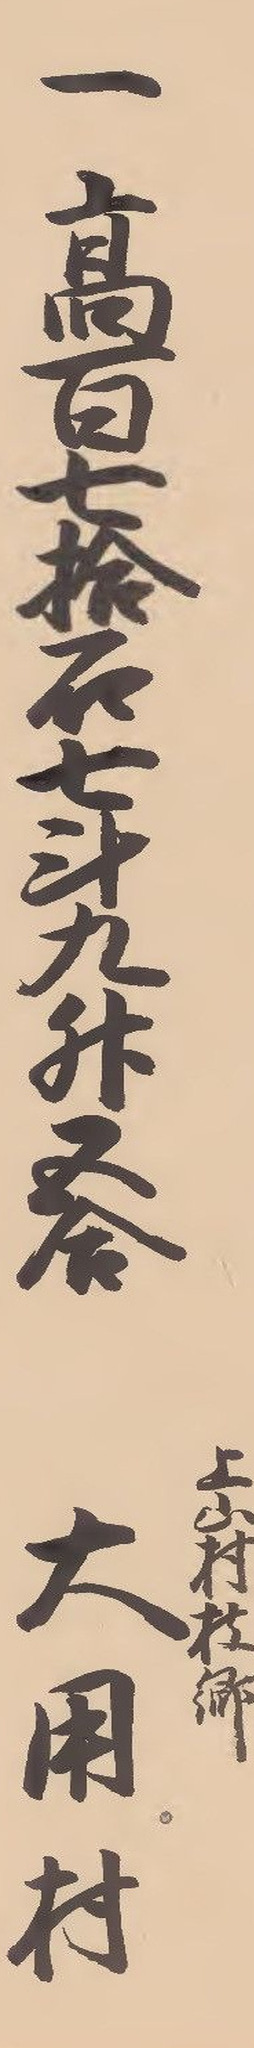一高百七拾石七斗九升五合大用村
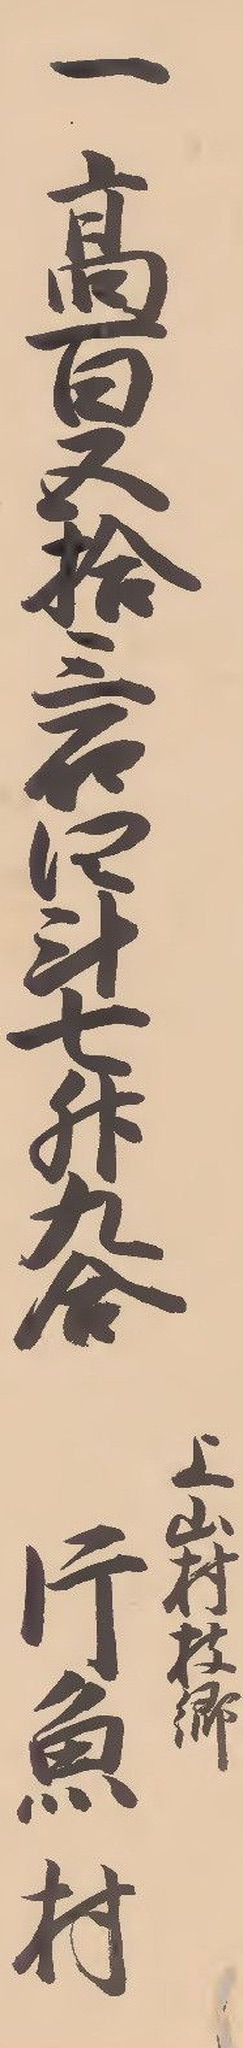一高百五拾三石四斗七升九合片魚村
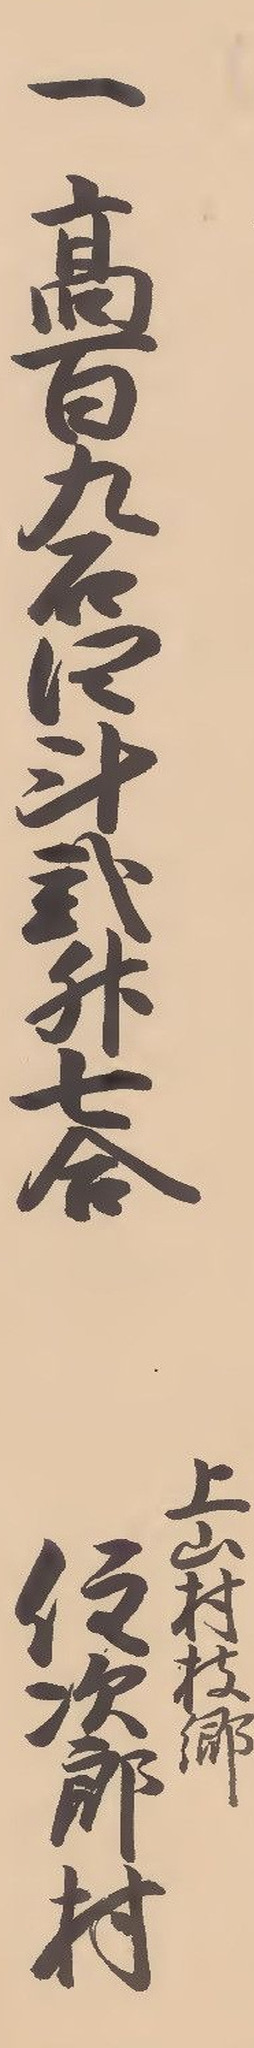一高百九石四斗弐升七合住次郎村
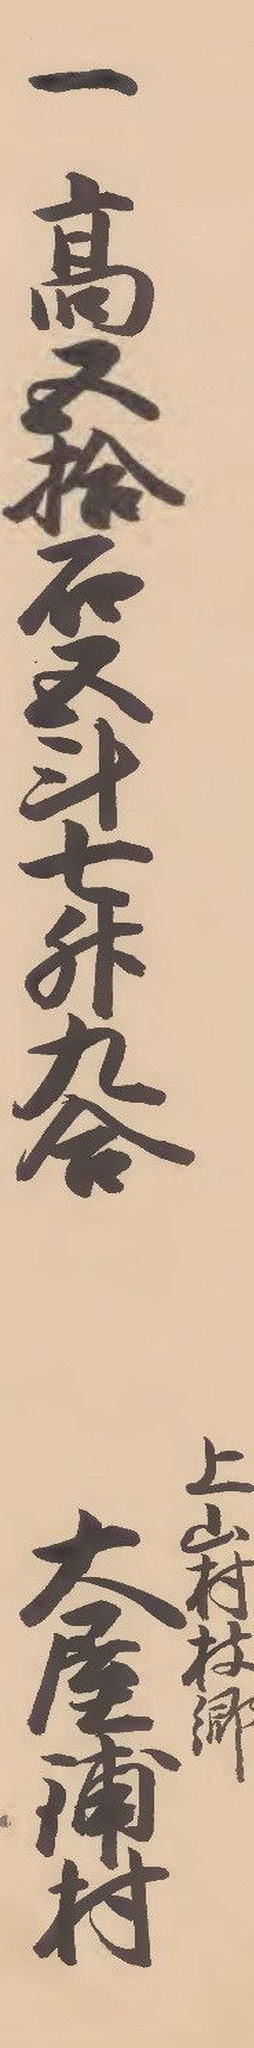一高五拾石五斗七升九合大屋浦村
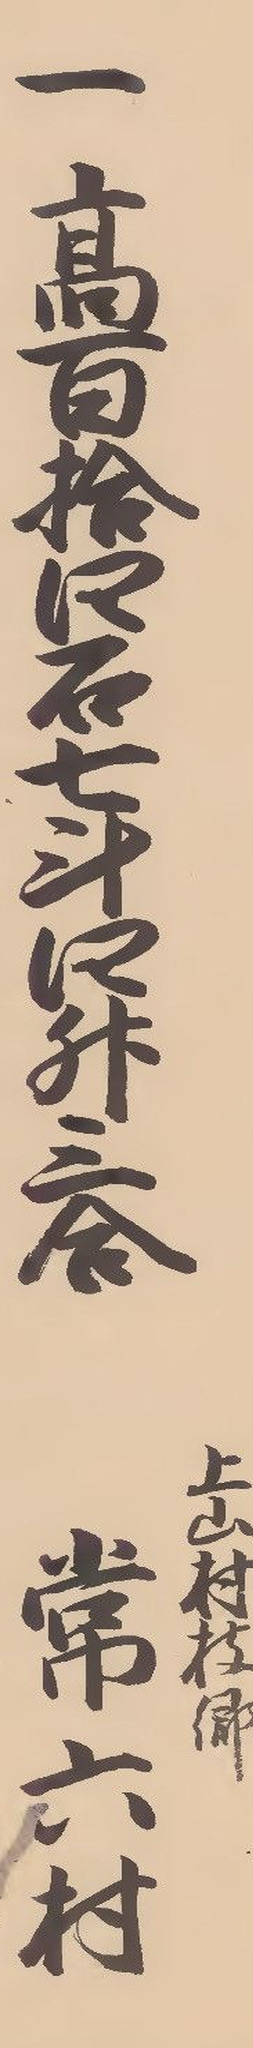一高百拾四石七斗四升三合常六村
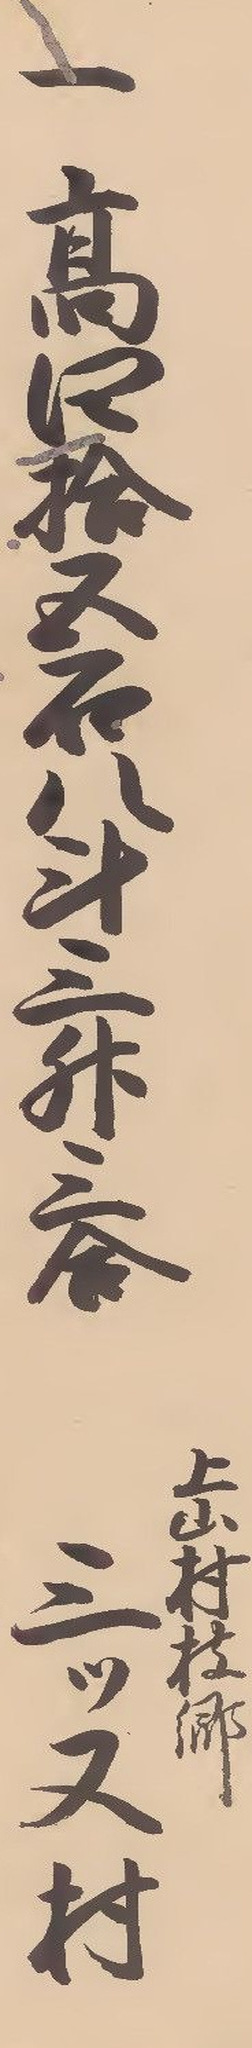一高四拾五石八斗三升三合三ツ又村
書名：土佐国郷帳
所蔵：国立公文書館 National Archives of Japan
